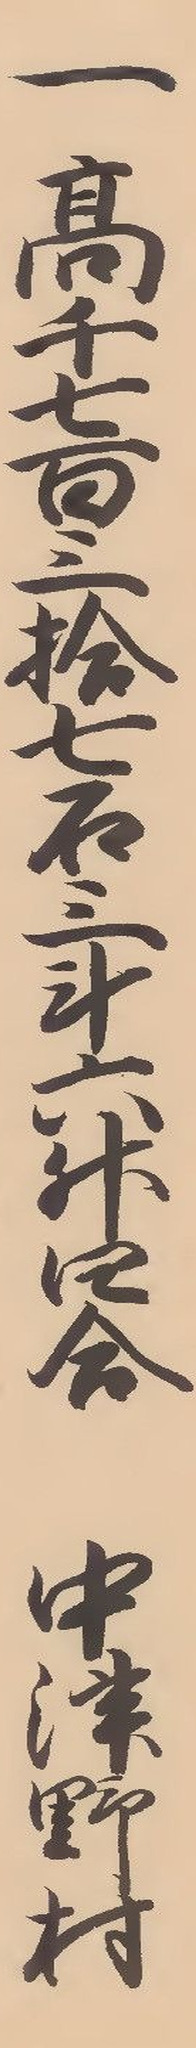一高千七百三拾七石三斗六升四合中津野村
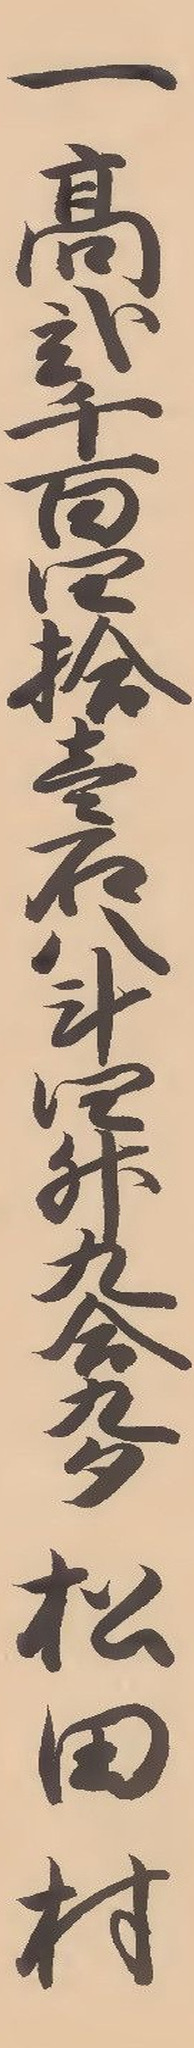一高弐千百四拾壱石八斗四升九合九勺松田村
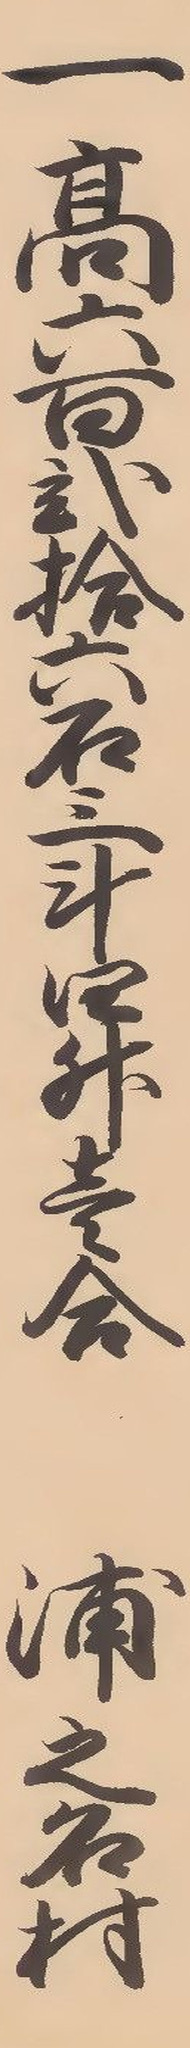一高六百弐拾六石三斗四升壱合浦之名村
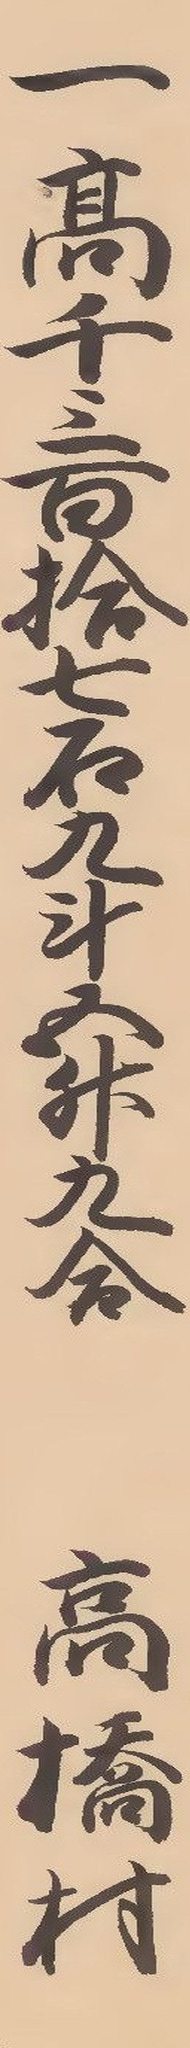一高千三百拾七石九斗五升九合高橋村
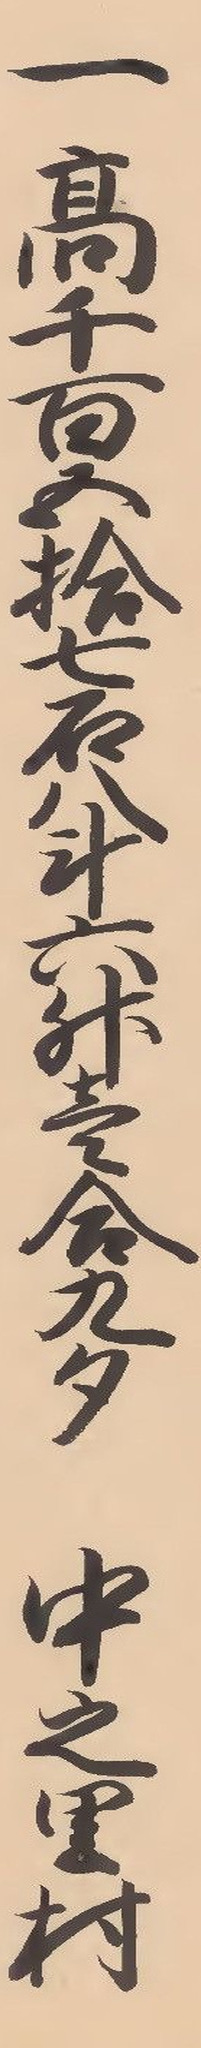一高千百五拾七石八斗六升壱合九勺中之里村
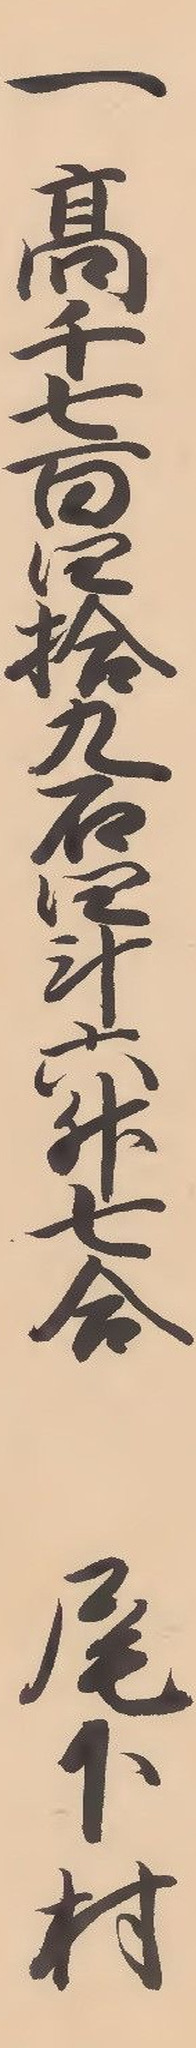一高千七百四拾九石四斗六升七合尾下村
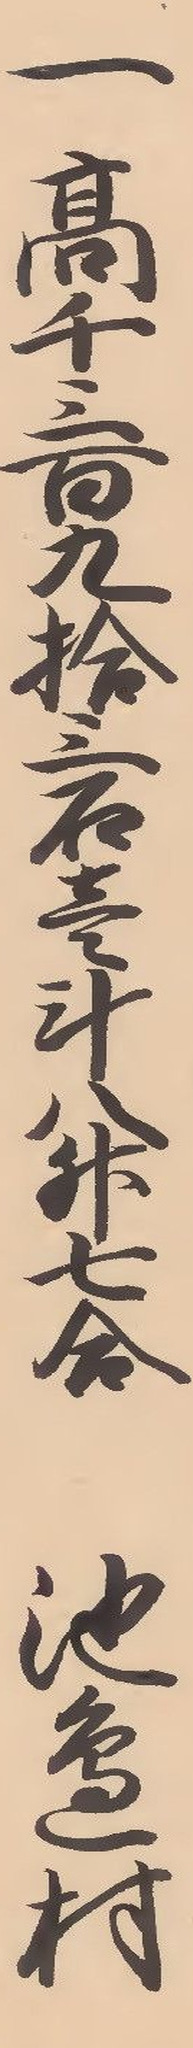一高千三百九拾三石壱斗八升七合池辺村
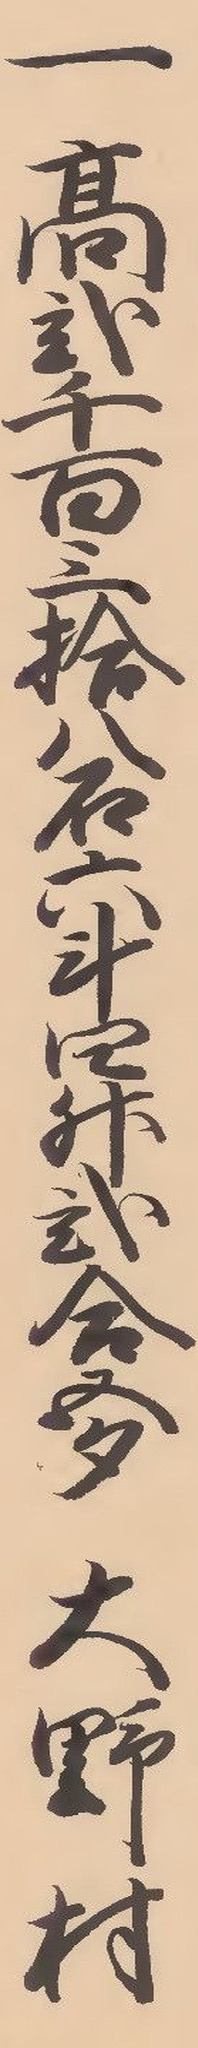一高弐千百三拾八石六斗四升弐合五尺大野村

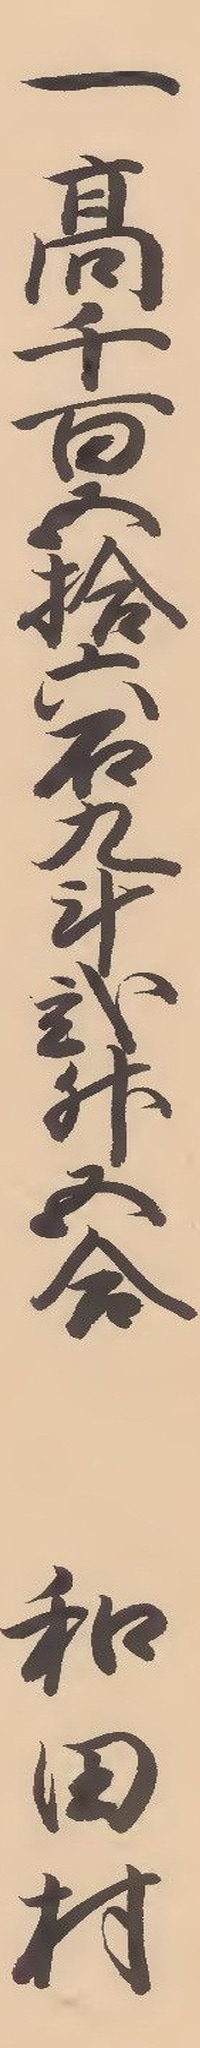一高千百五拾六石九斗弐升五合和田村
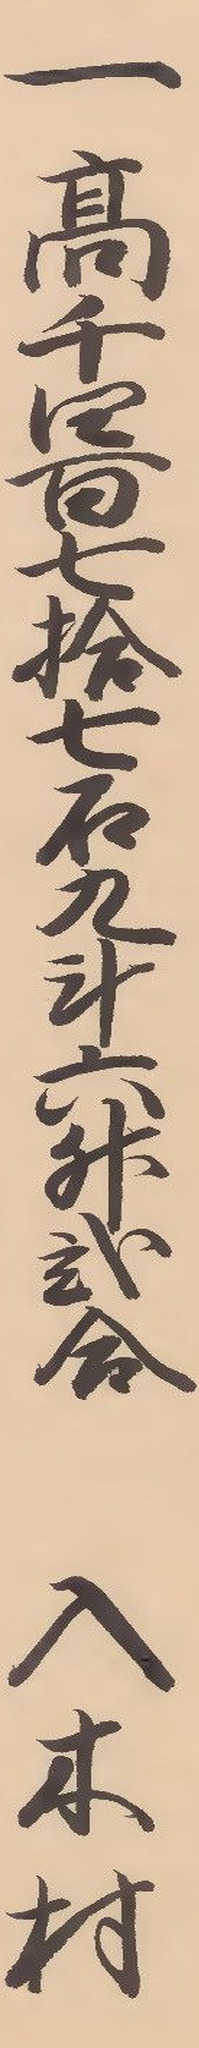一高千四百七拾七石九斗六升弐合入木村
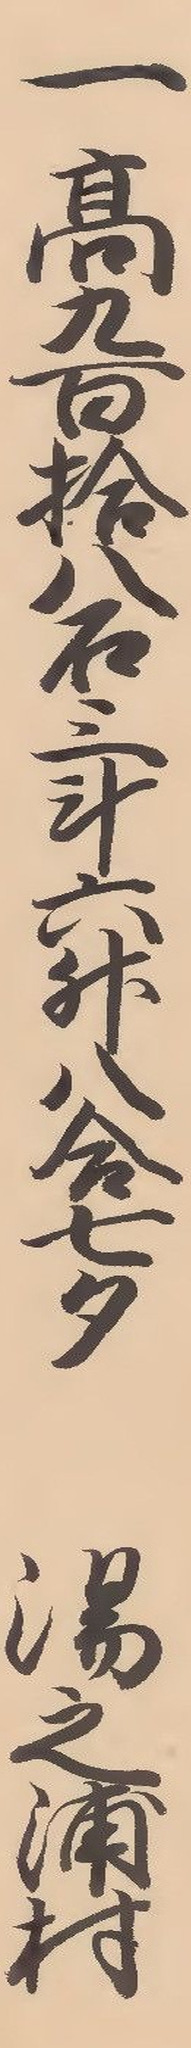一高九百拾八石三斗六升八合七勺湯之浦村
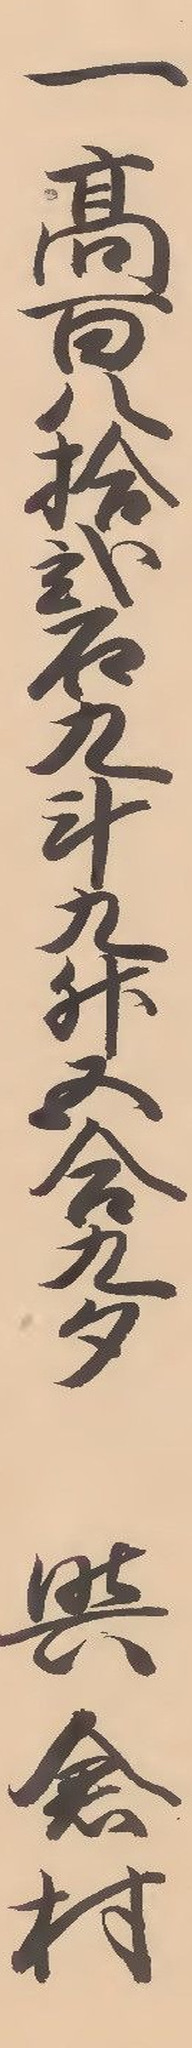一高百八拾弐石九斗九升五合九勺与倉村
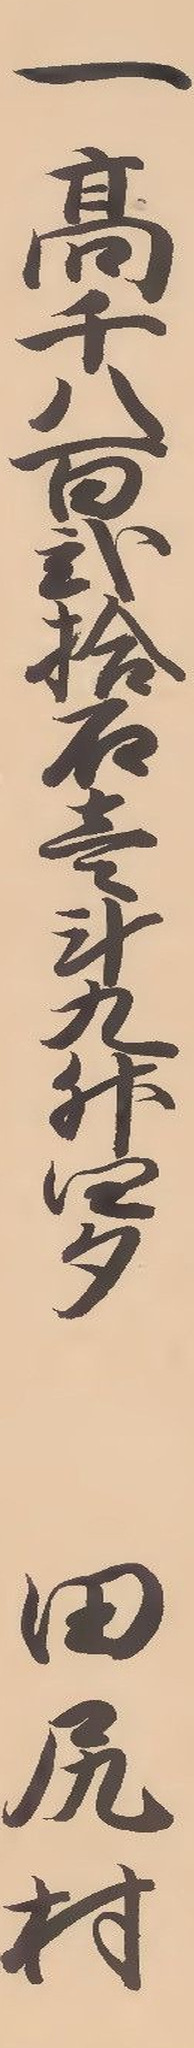一高千八百弐拾石壱斗九升四勺田尻村
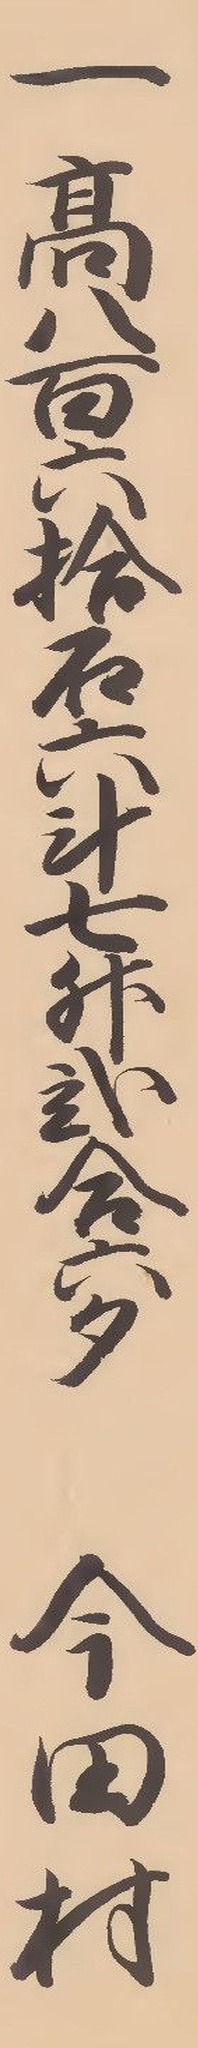一高八百六拾石六斗七升弐合六勺今田村
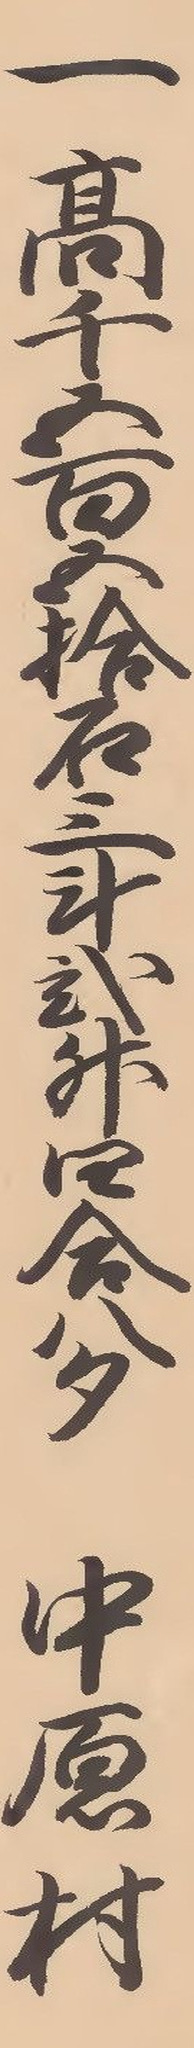一高千五百五拾石三斗弐升四合八勺中原村
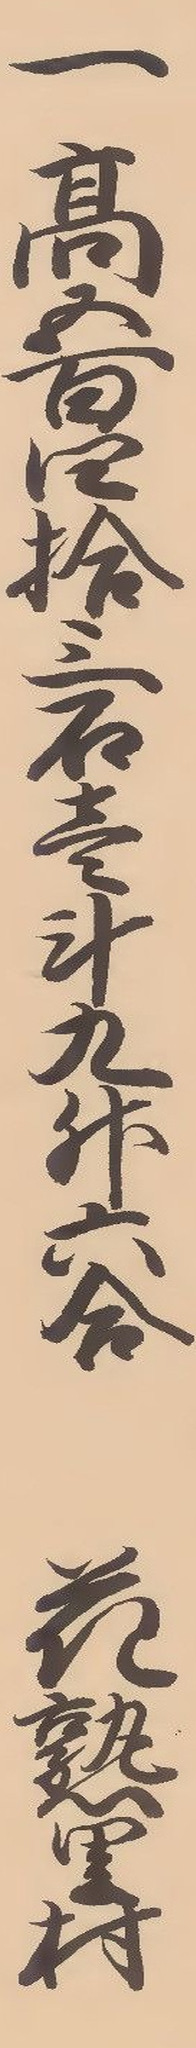一高五百四拾三石壱斗九升六合花熟里村
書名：薩摩国郷帳
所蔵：国立公文書館 National Archives of Japan
